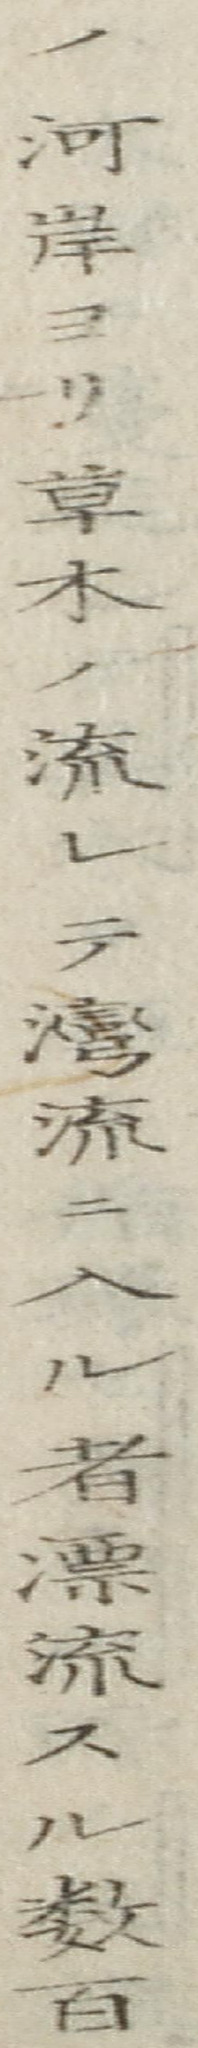ノ河岸ヨリ草木ノ流レテ湾流ニ入ル者漂流スル数百
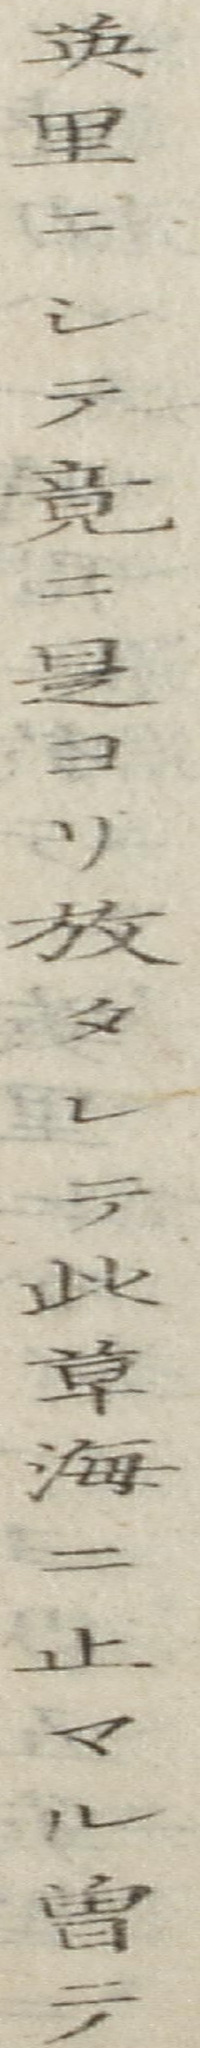英里ニシテ竟ニ是ヨリ放タレテ此草海ニ止マル曽テ
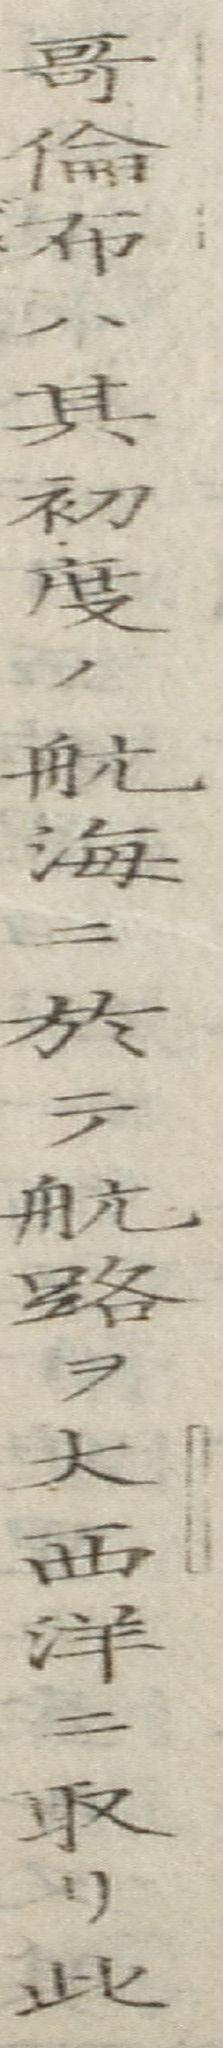哥倫布ハ其初度ノ航海ニ於テ航路ヲ大西洋ニ取リ此
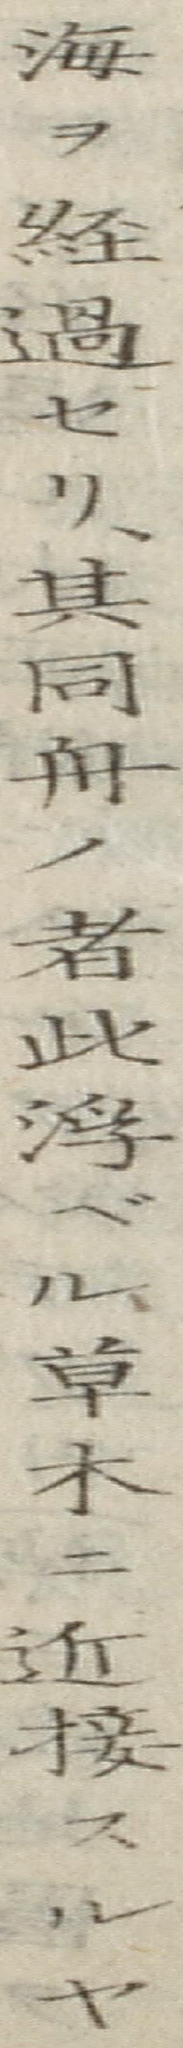海ヲ経過セリ、其同舟ノ者此浮ベル草木ニ近接スルヤ
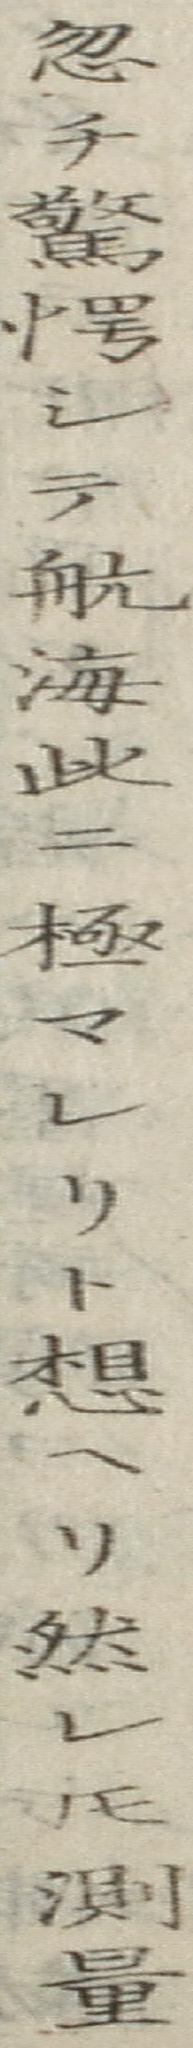忽チ驚愕シテ航海此ニ極マレリト想ヘリ然レトモ測量
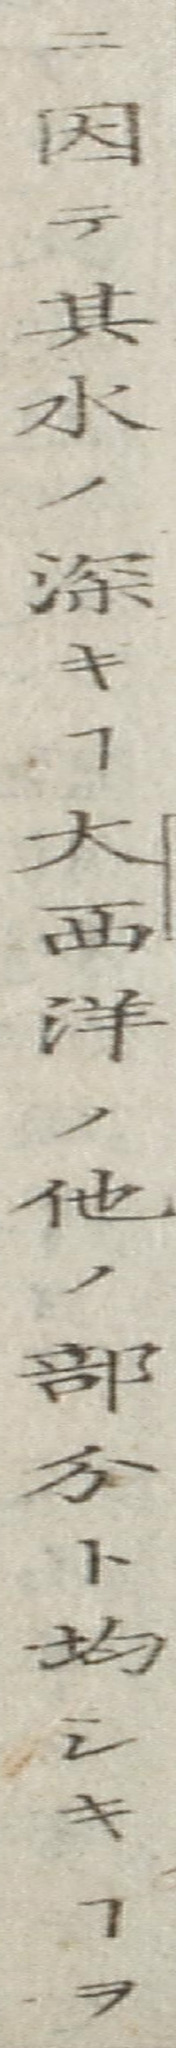ニ因テ其水ノ深キヿ大西洋ノ他ノ部分ト均シキヿヲ
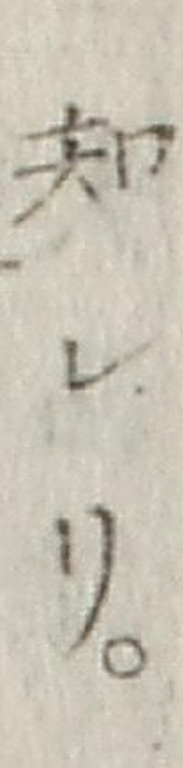知レリ。
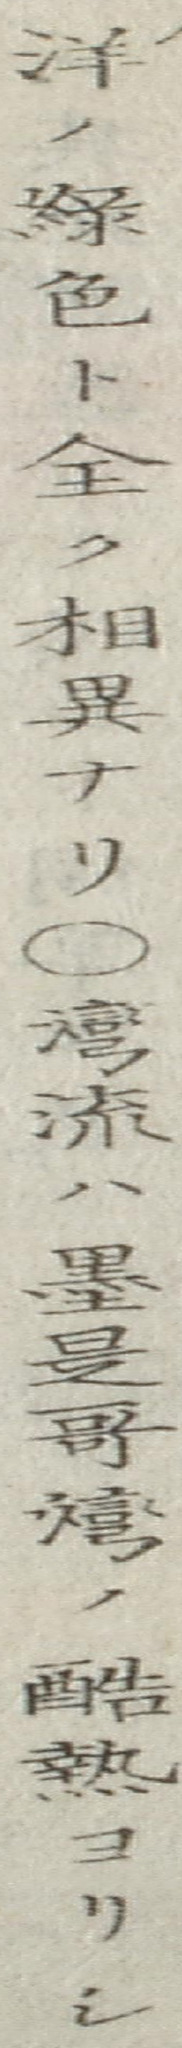洋ノ緑色ト全ク相異ナリ○湾流ハ墨是哥湾ノ酷熱ヨリシ
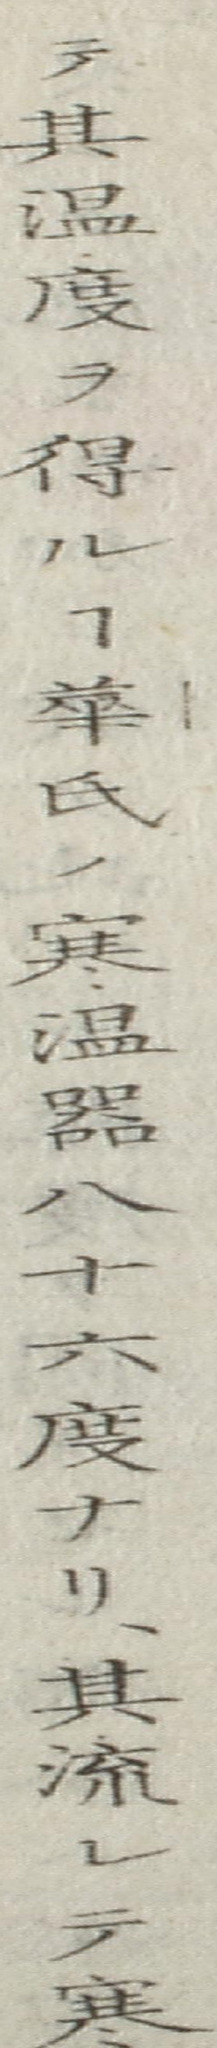テ其温度ヲ得ルヿ華氏ノ寒温器八十六度ナリ、其流レテ寒
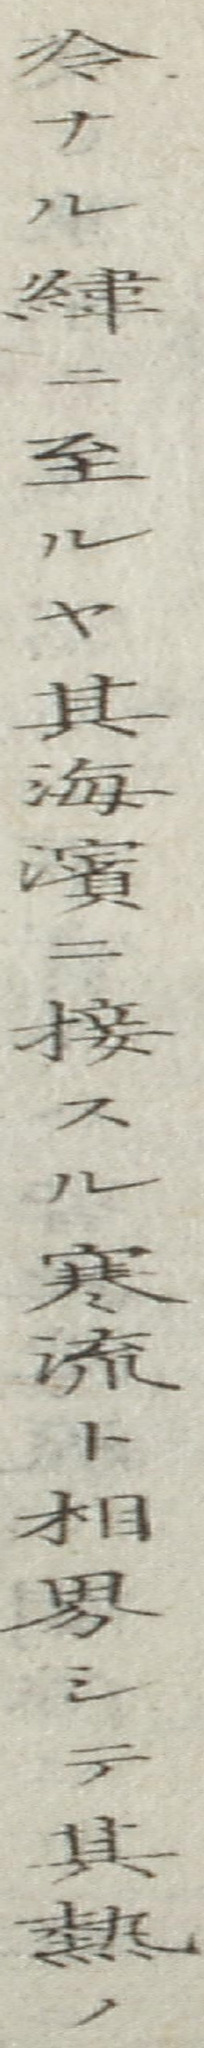冷ナル緯ニ至ルヤ其海浜ニ接スル寒流ト相界シテ其熱ノ
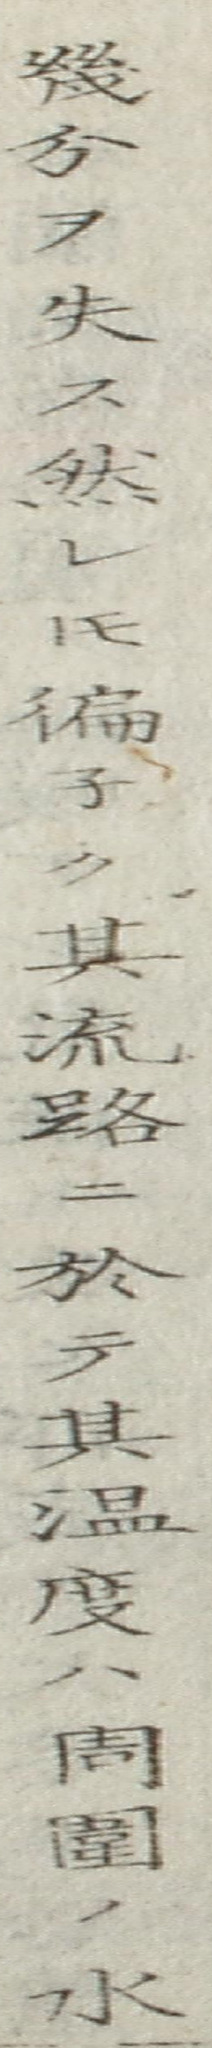幾分ヲ失ス然レトモ徧子ク其流路ニ於テ其温度ハ周囲ノ水
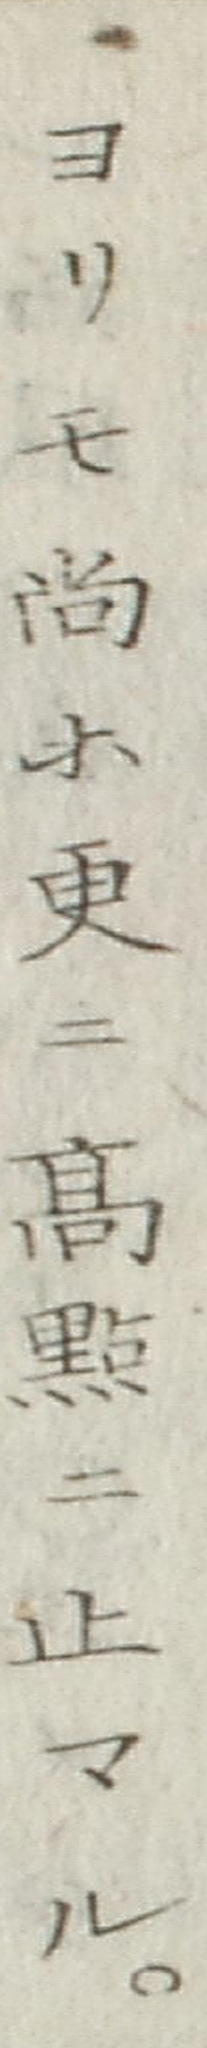ヨリモ尚ホ更ニ高点ニ止マル。
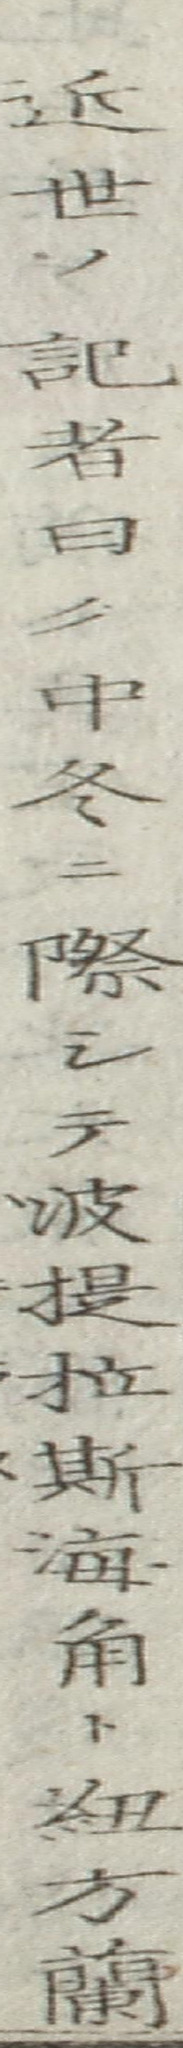近世ノ記者曰ク中冬ニ際シテ波提拉斯海角ト紐方蘭
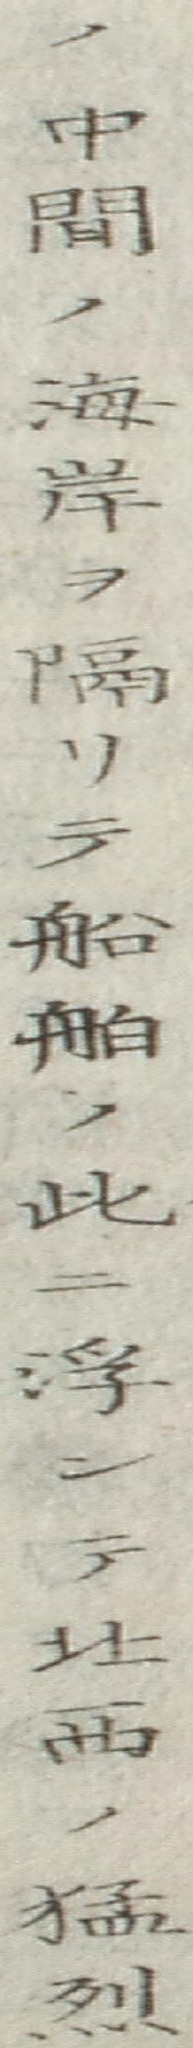ノ中間ノ海岸ヲ隔リテ船舶ノ此ニ浮ンテ北西ノ猛烈
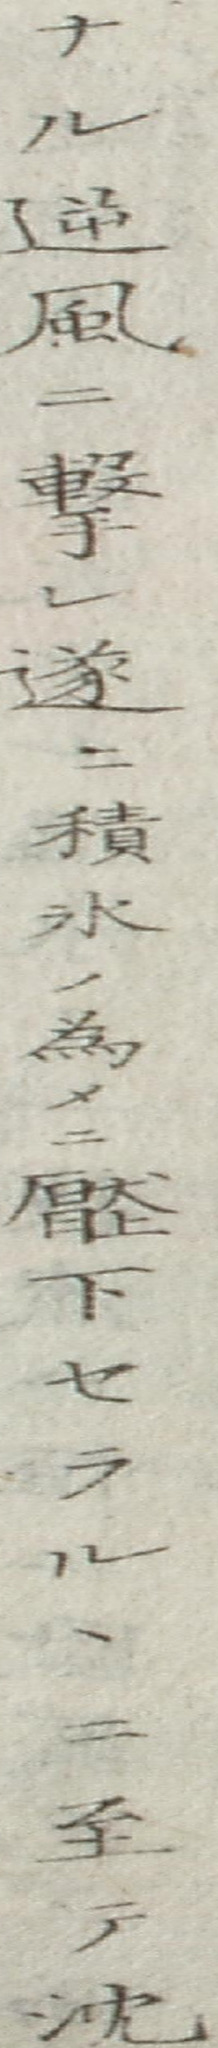ナル逆風ニ撃レ遂ニ積氷ノ為メニ圧下セラルヽニ至テ沈
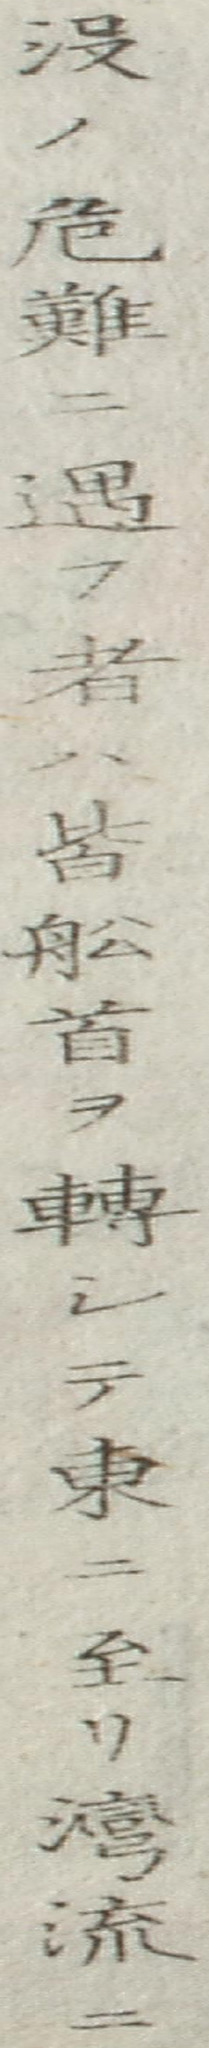没ノ危難ニ洲遇フ者ハ皆船首ヲ転シテ東ニ至リ湾流ニ
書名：地形論　巻二
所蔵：東京大学地震研究所図書室 Earthquake Research Institute Library, The University of Tokyo, JAPAN
